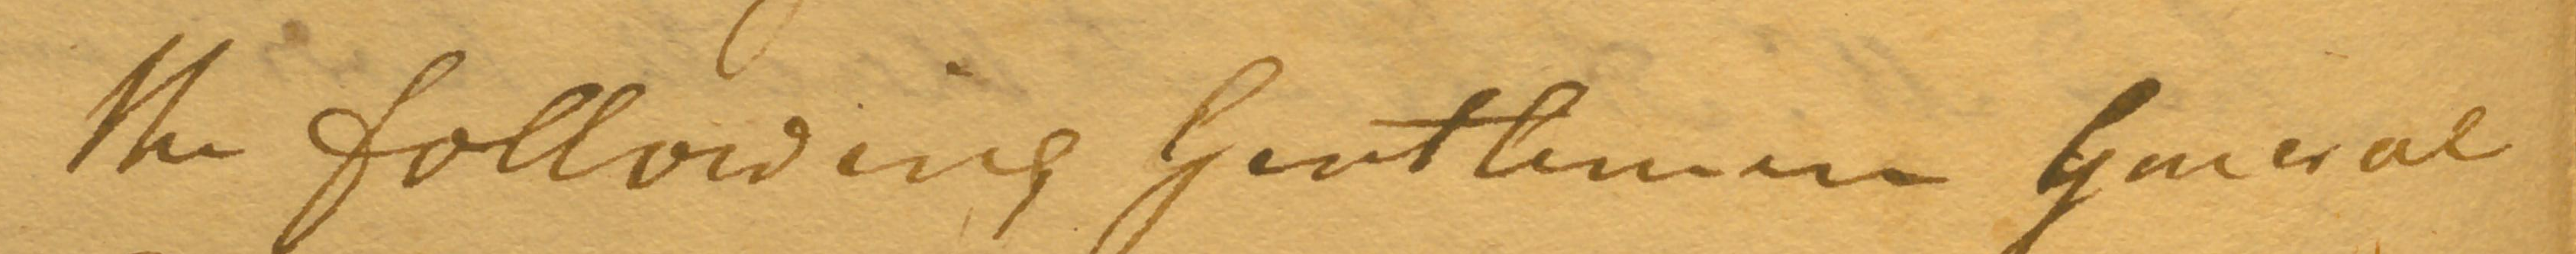the following Gentlemen General
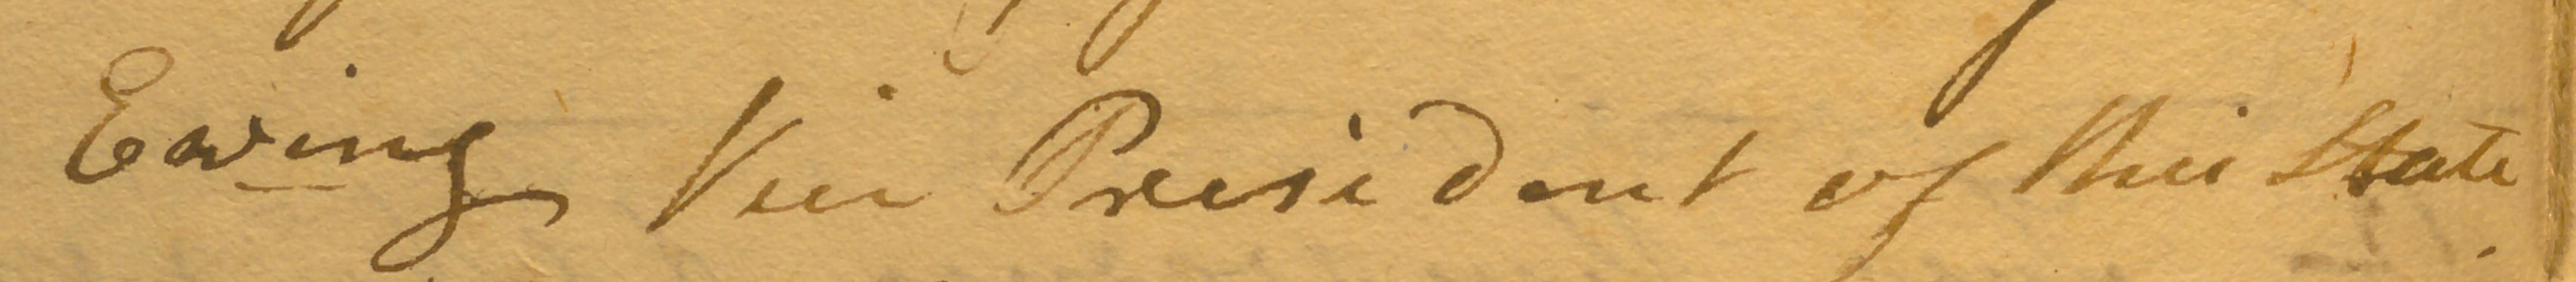Ewing Vice President of this State
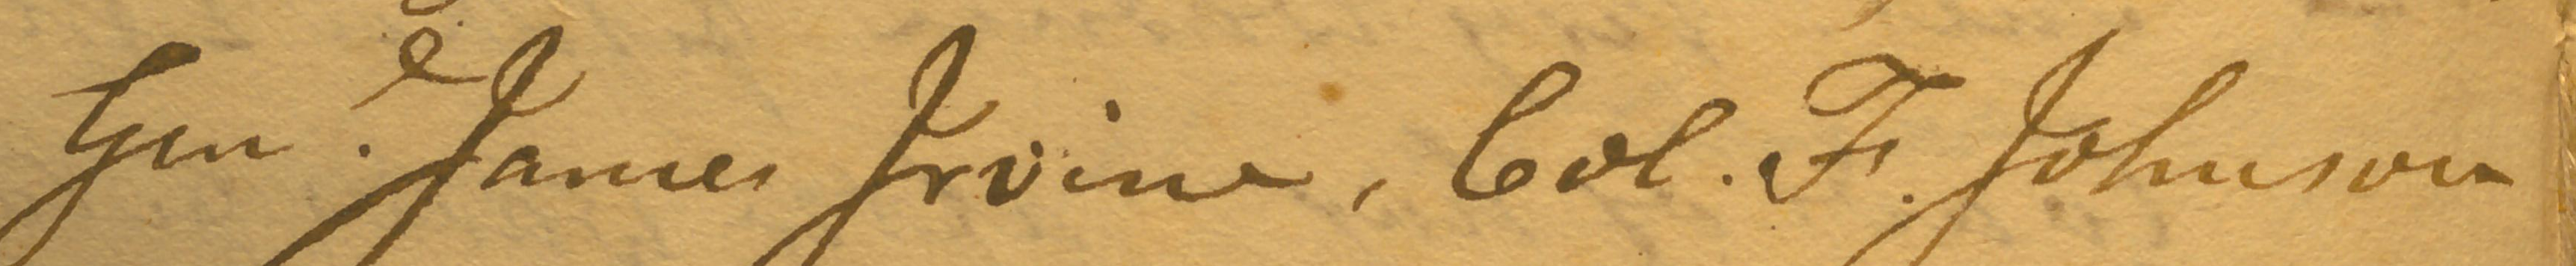Gen^l. James Irvine, Col. F. Johnson
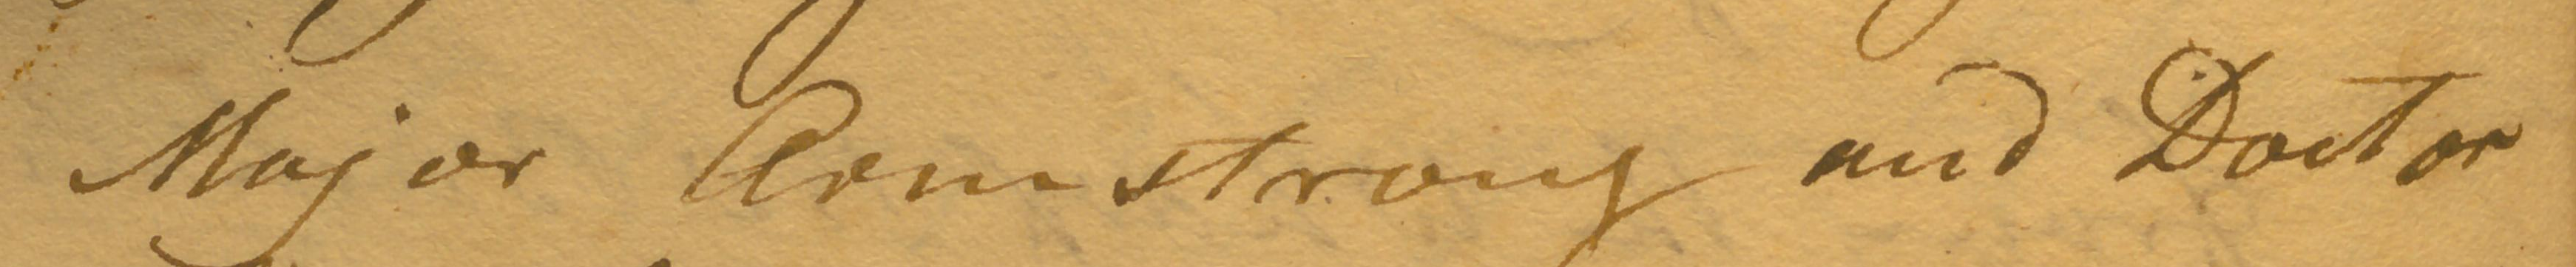Mayor Armstrong and Doctor or
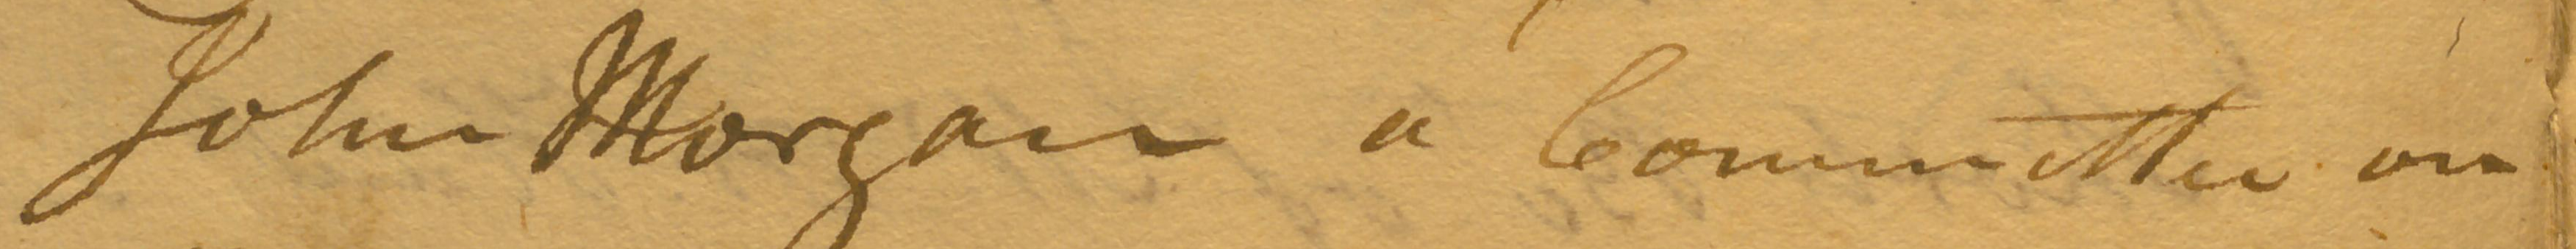John Morgan a Committee on
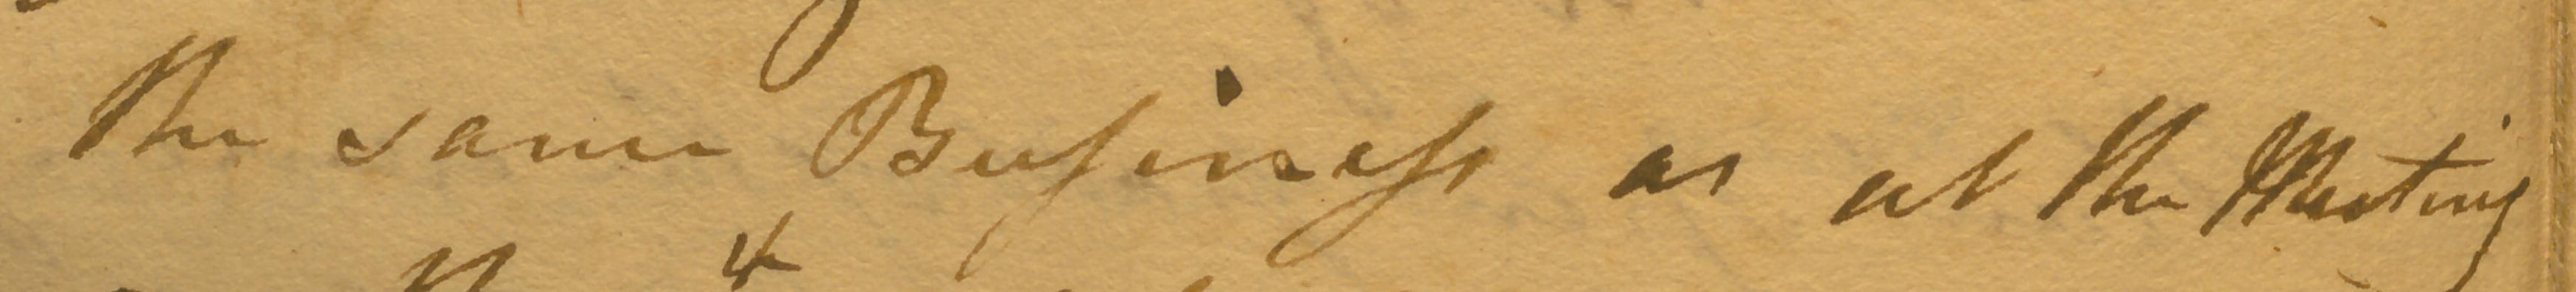the same Business as at the Meeting
